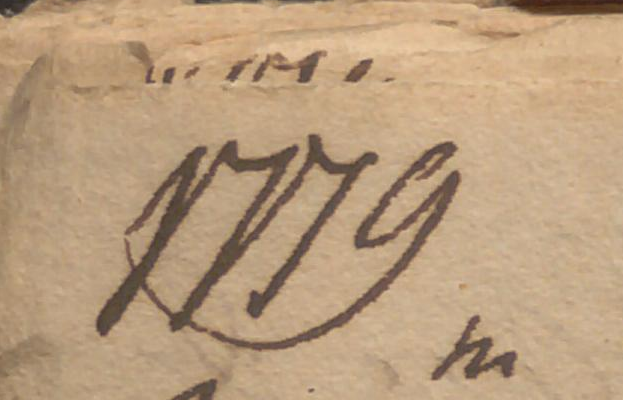1779
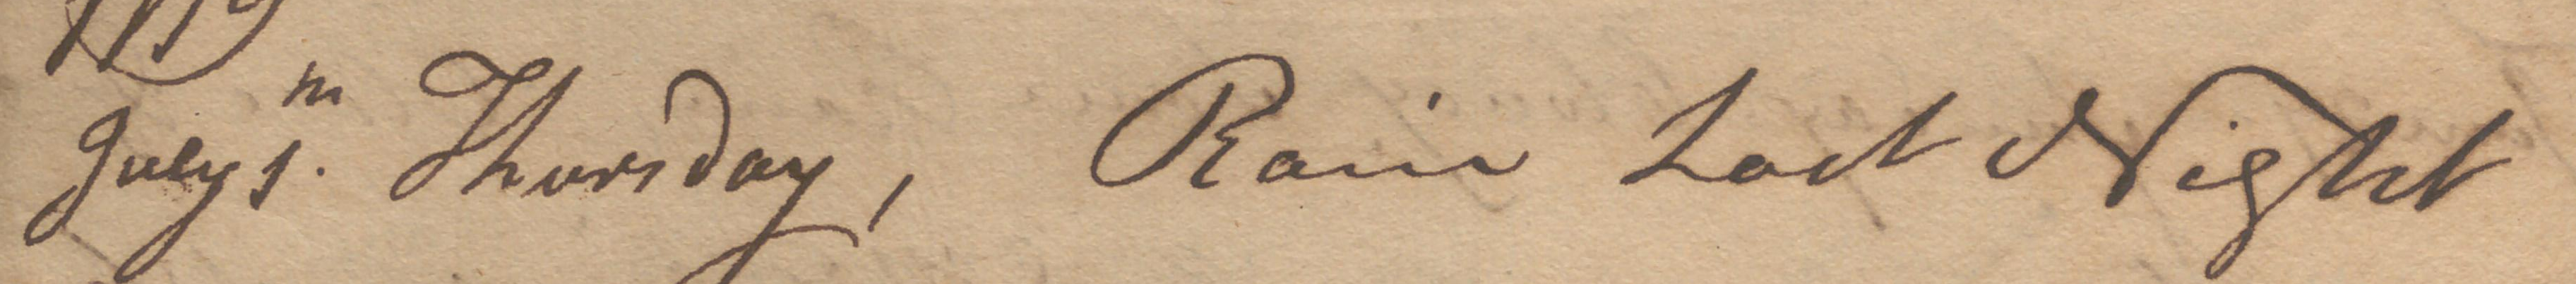July1^th. Thursday, Rain Last Night
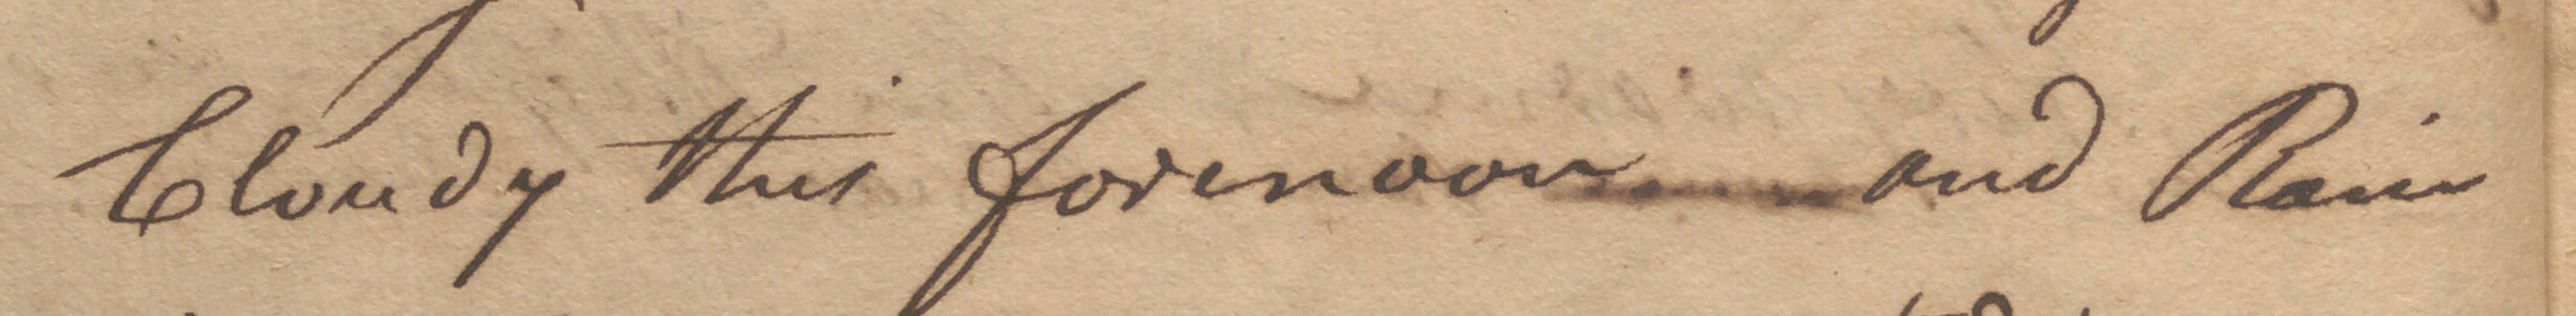Cloudy this forenoon and Rain
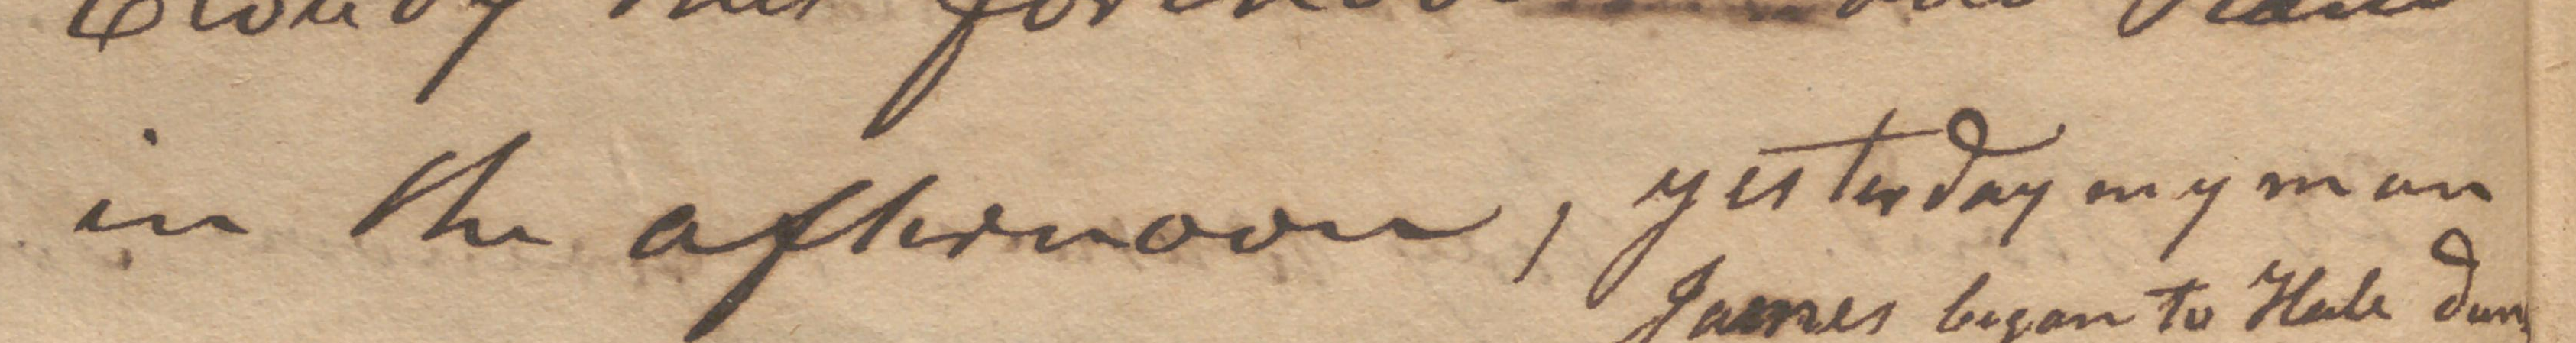in the afternoon, yesterday my man
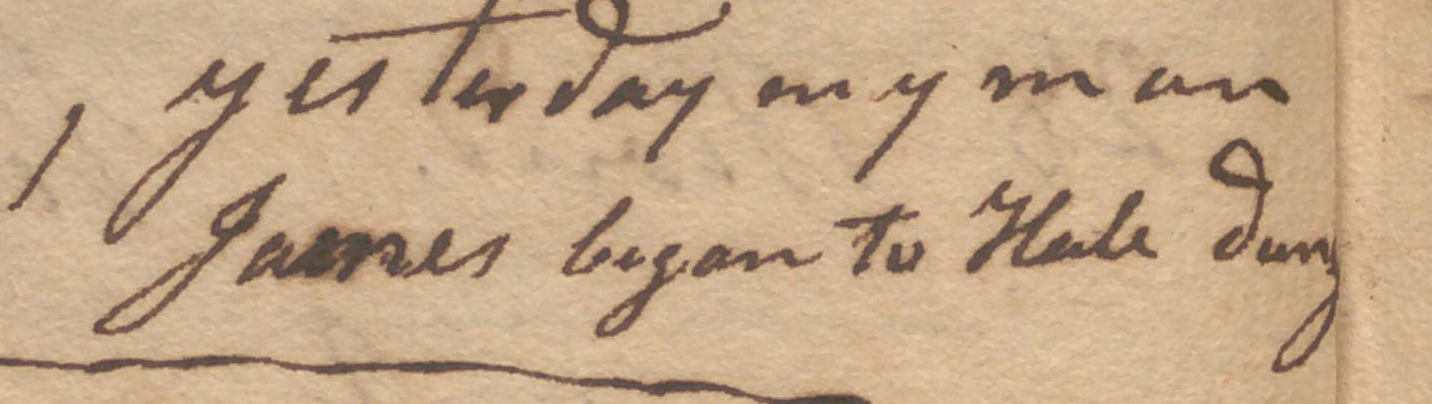James began to Hale dung
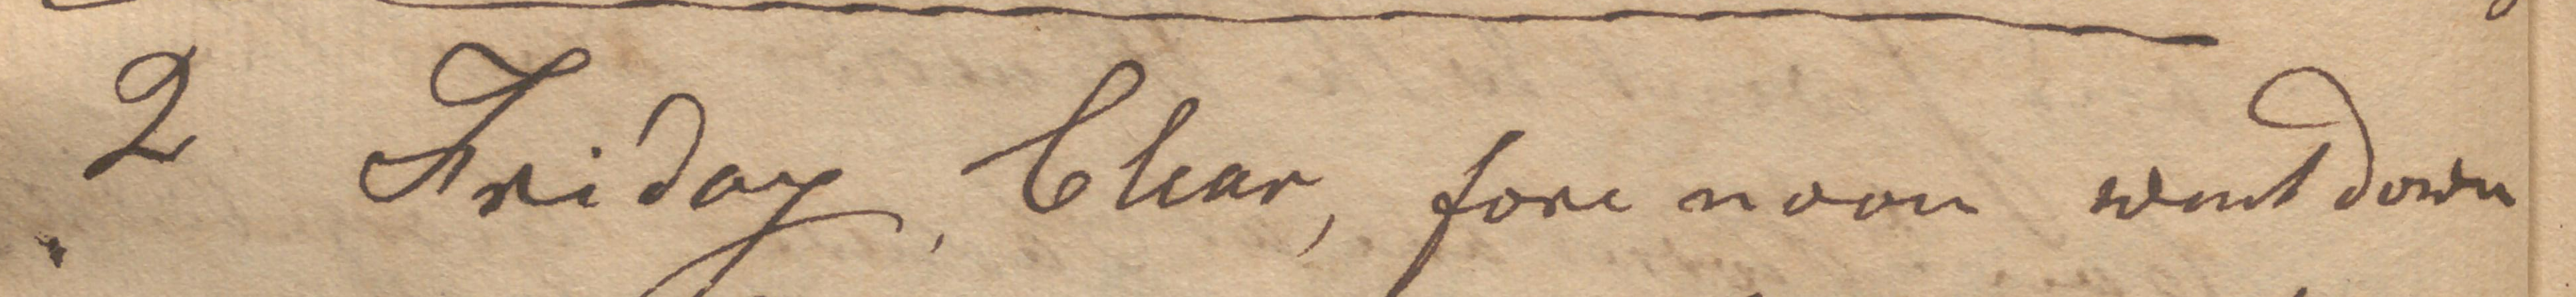2 Friday Clear forenoon went down
